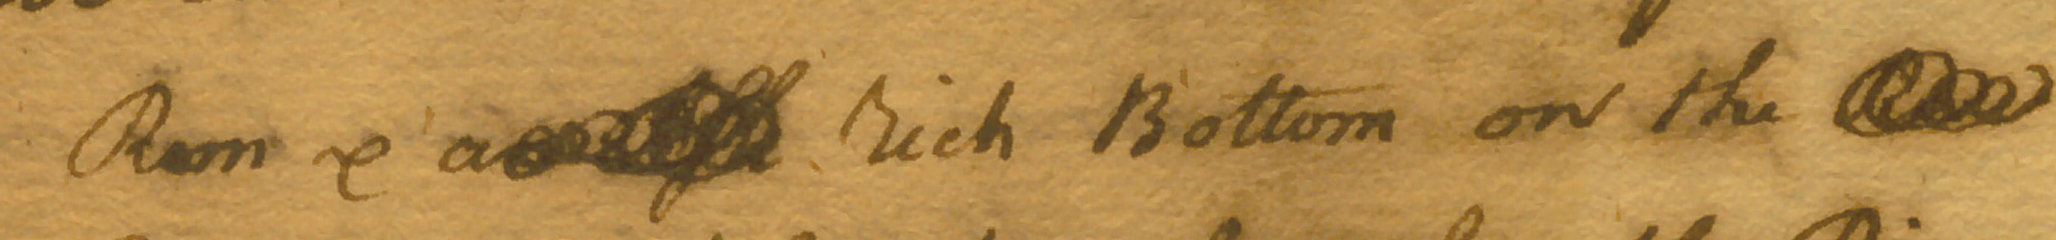Run & [_______] rich Bottom on the [___]
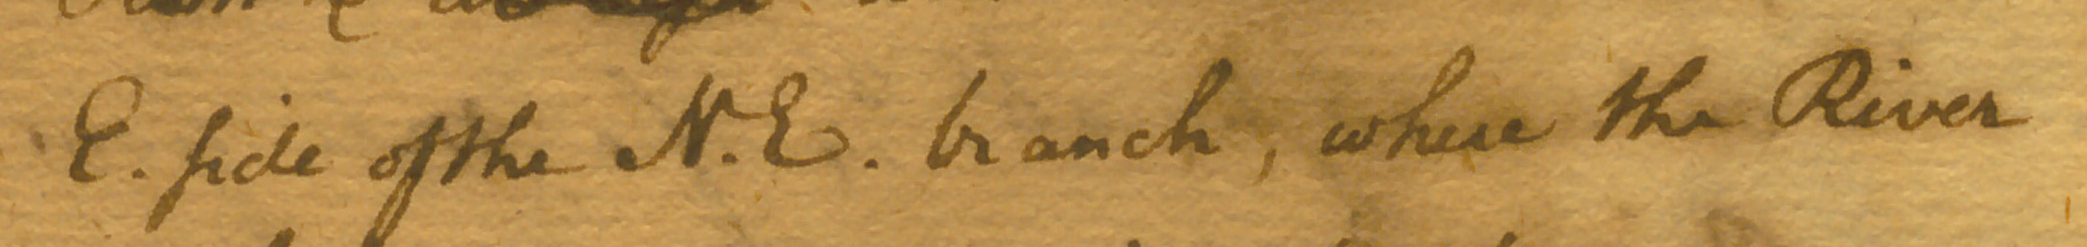E. side of the N.E. branch, where the River
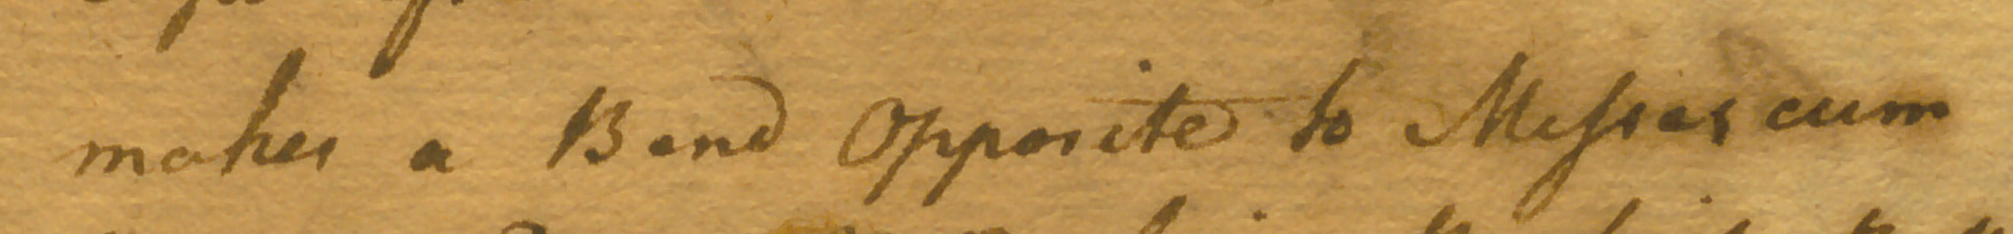makes a Band opposite to Messescum
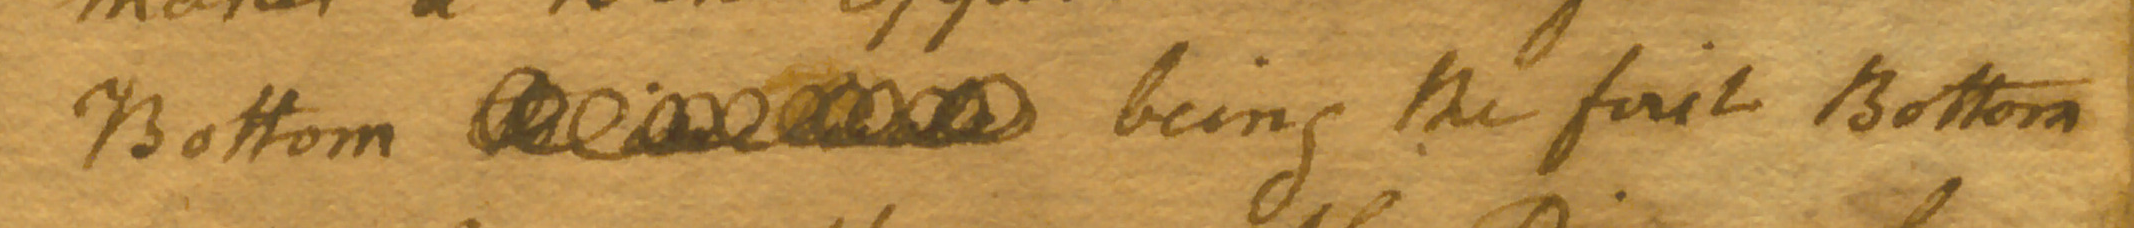Bottom [_________] being the first Bottom
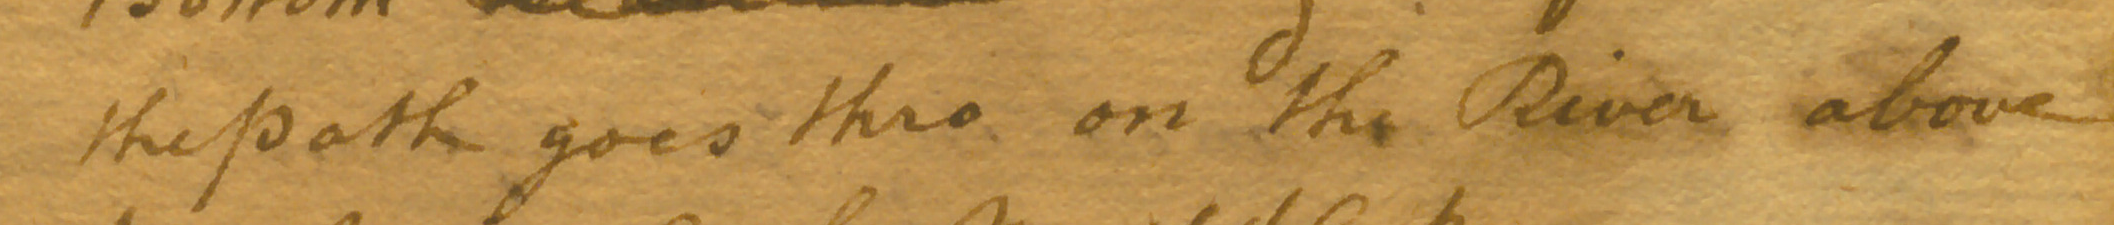the path goes thro on the River above
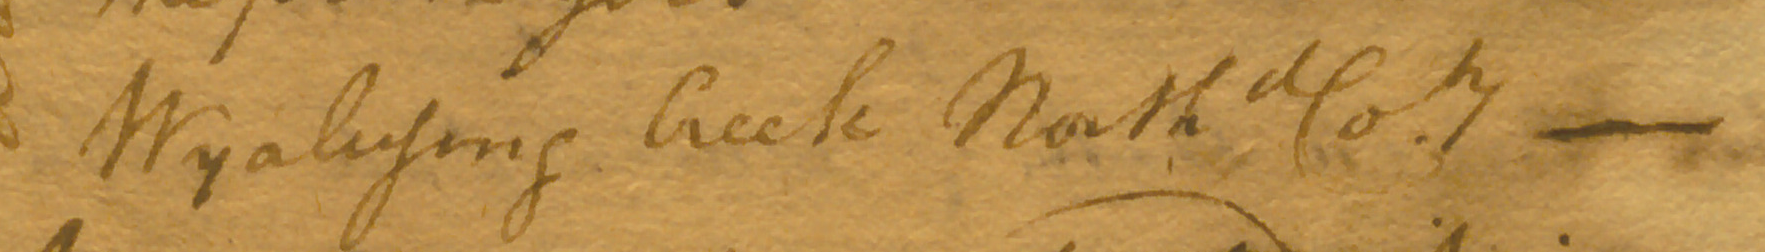Wyalusing Creek North^d Co.^ty-
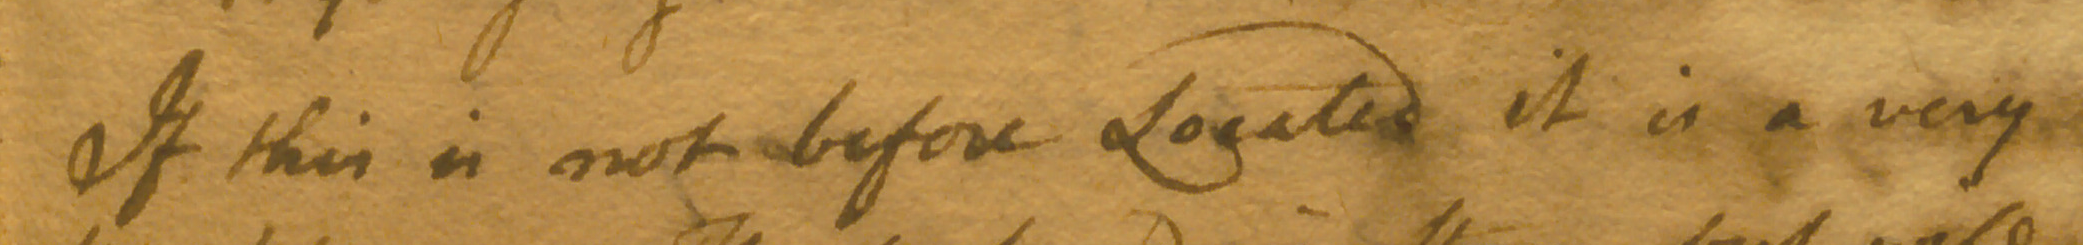If this is not before Located it is a very
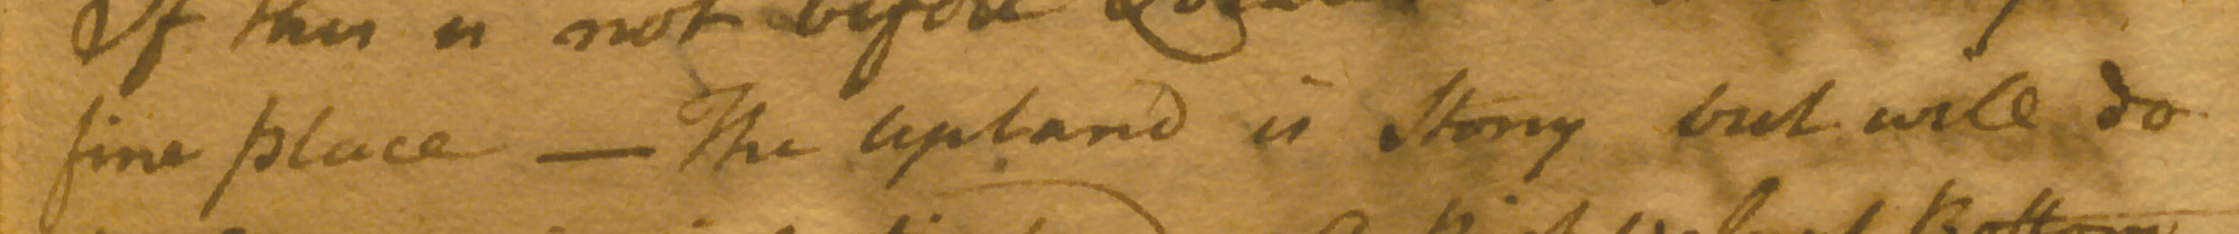fine place- The upland is stony but will do
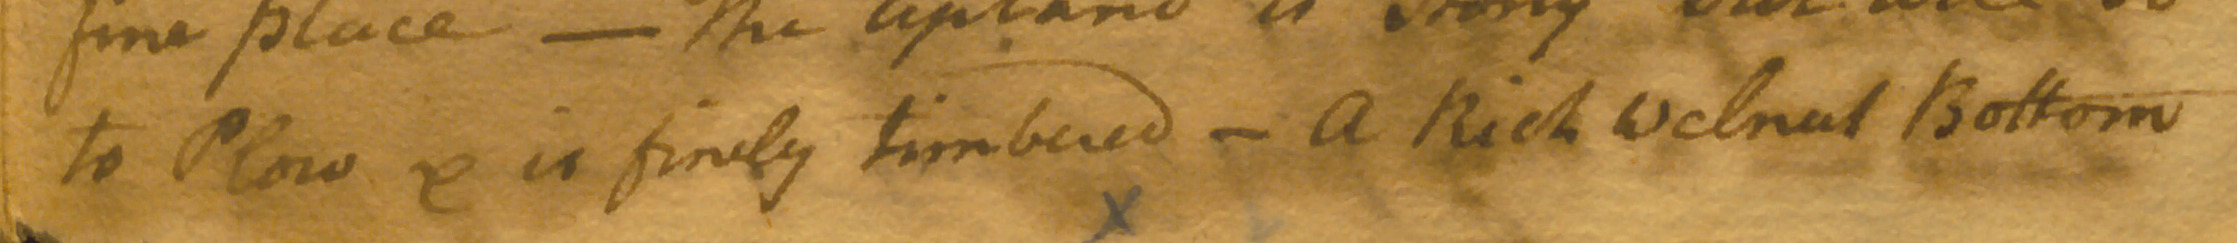to Plow & is finely timbered- a Rich walnut Bottom
